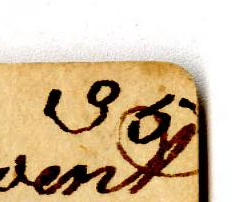35
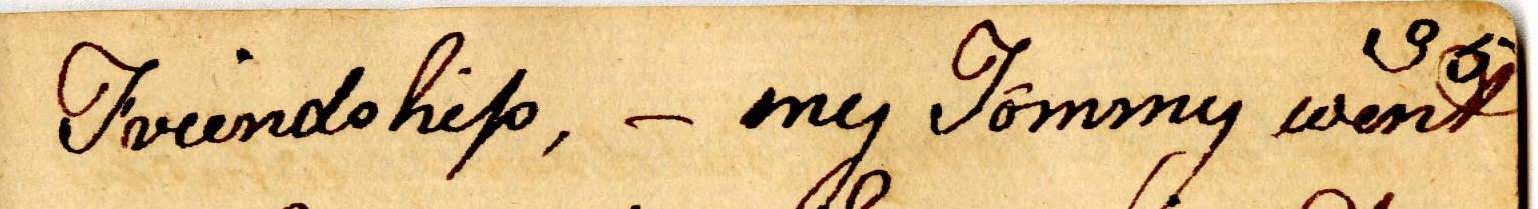Friendship,- my Tommy went
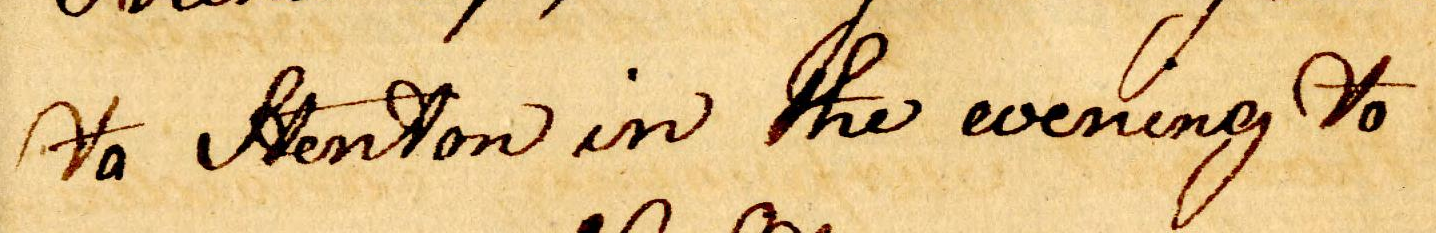to Stenton in the evening to
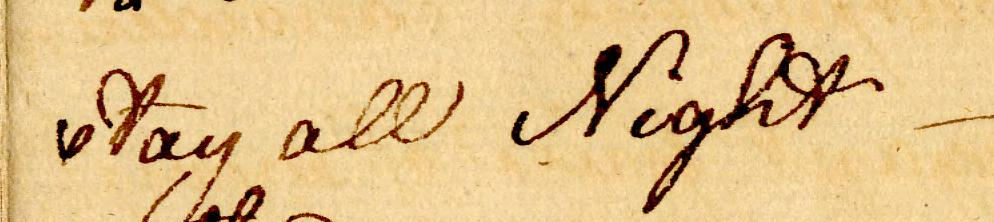stay all Night-
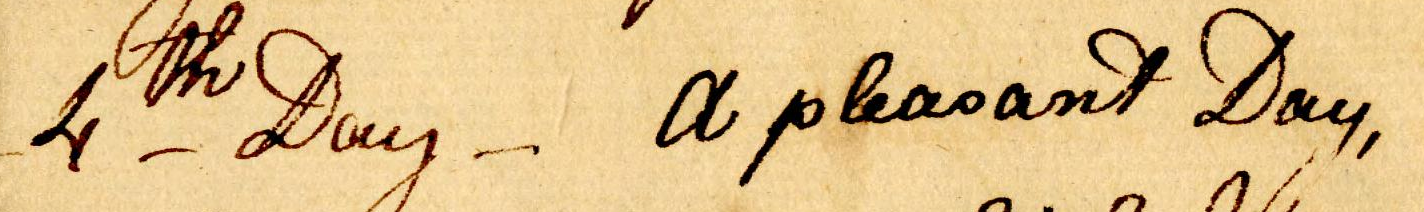4^th Day- A pleasant Day,
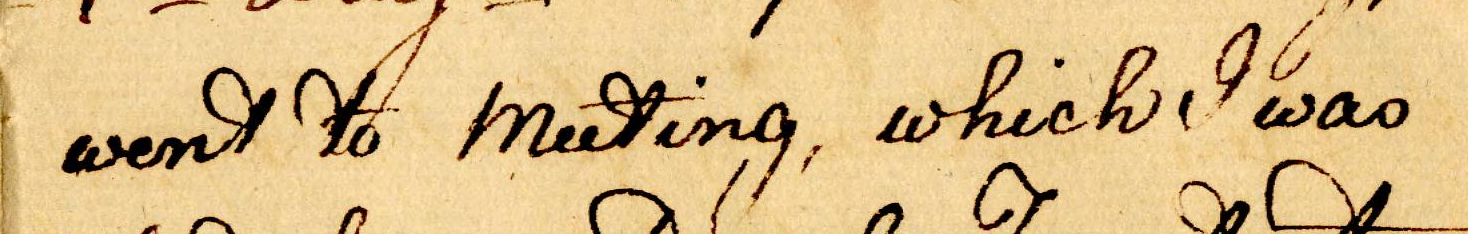went to meeting, which I was
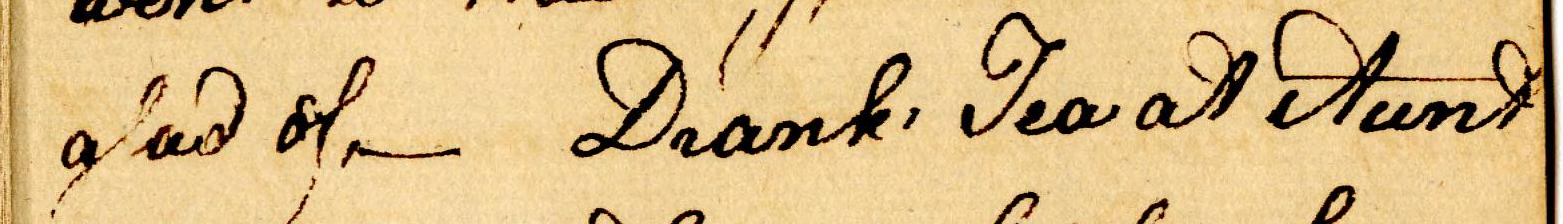glad of- Drank Tea at Aunt
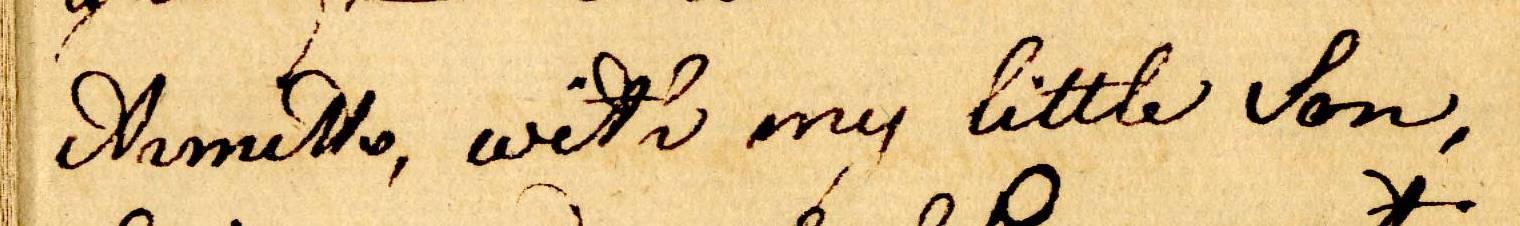Armitts, with my little Son,
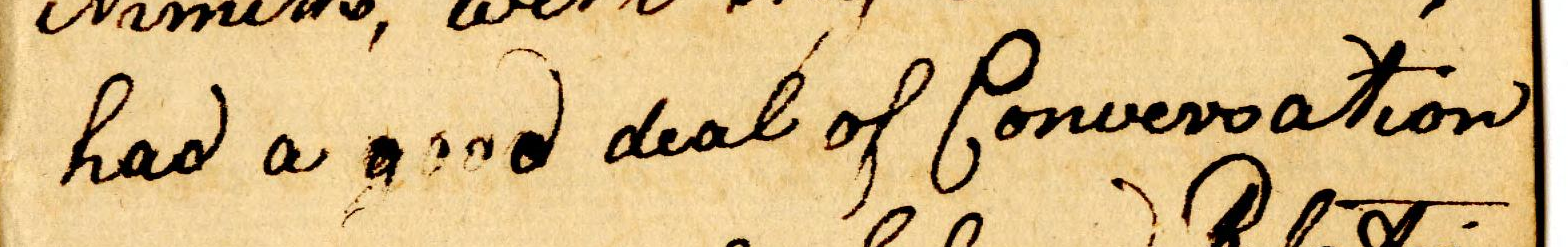had a good deal of Conversation
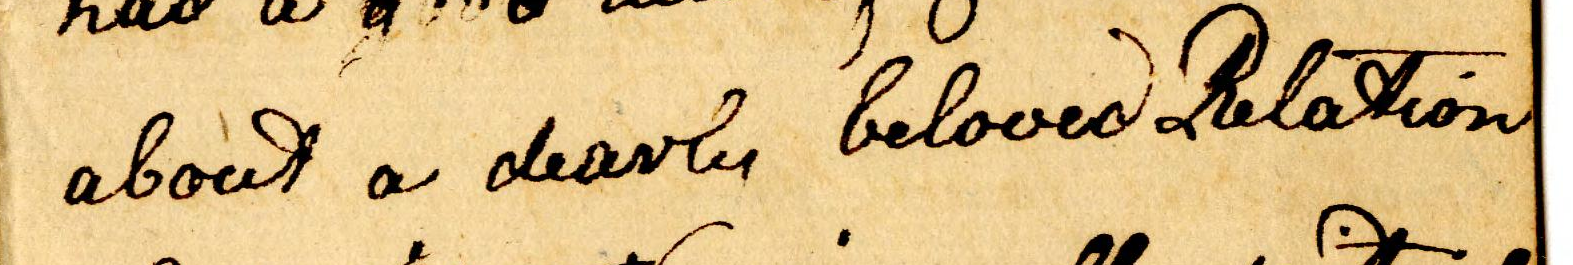about a dearly beloved Relation
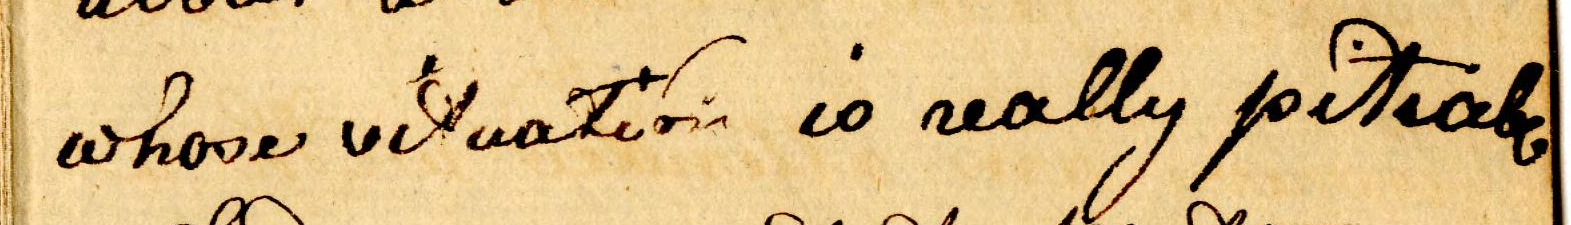whose situation is really pitiabe
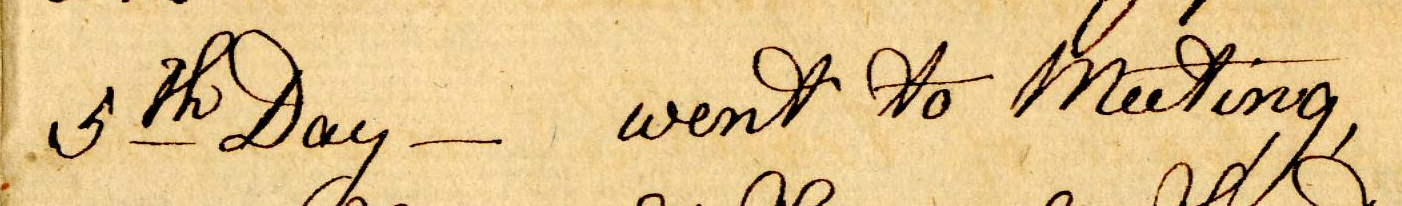5^th Day- went to Meeting,
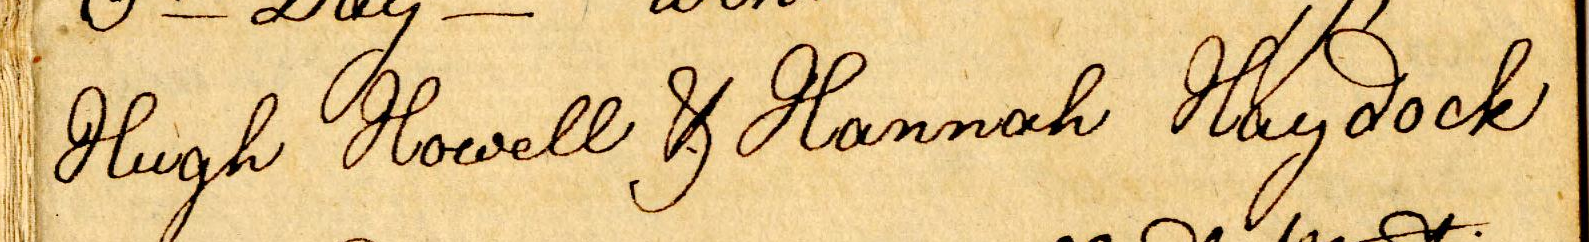Hugh Howell & Hannah Haydock
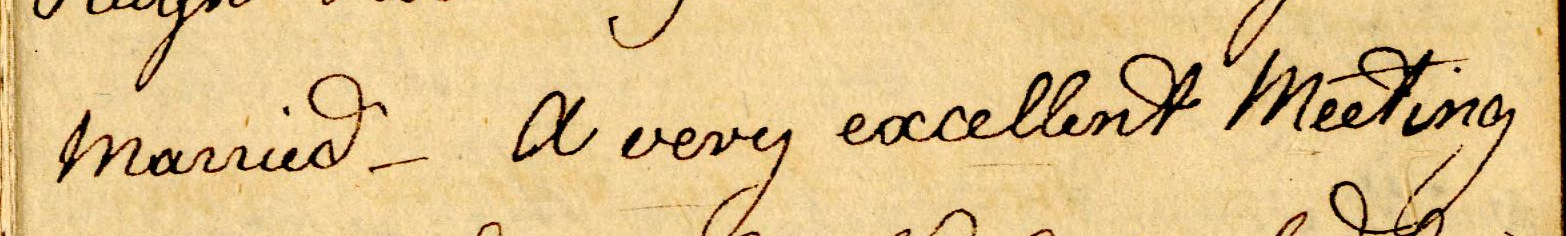Married- A very excellent Meeting
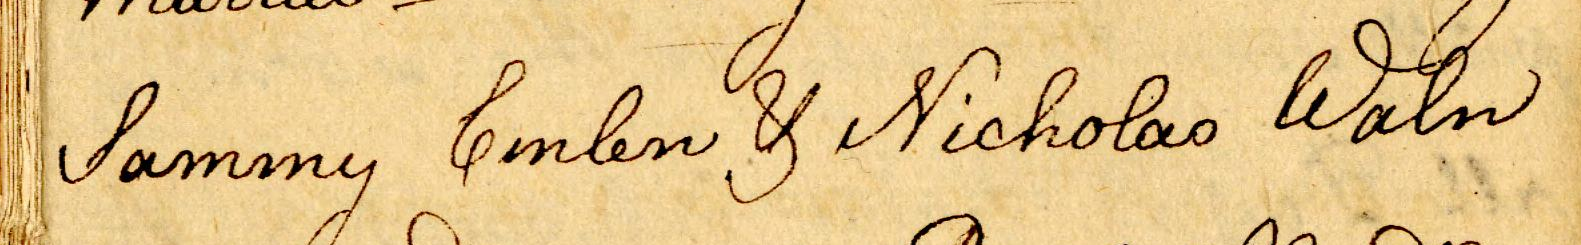Sammy Emlen & Nicholas Waln
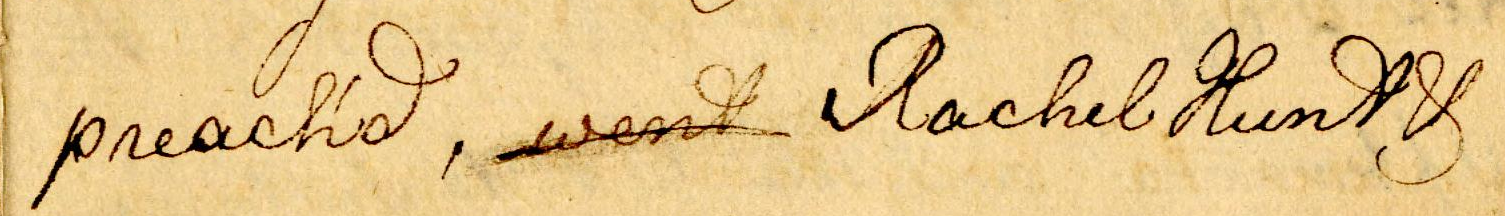preach'd, went Rachel Hunt &
